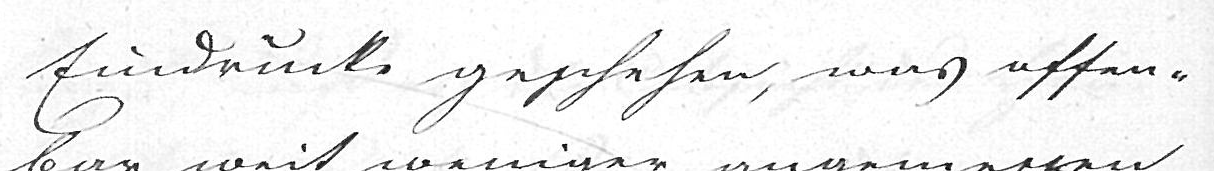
Eindrucke geschehen, was offen-
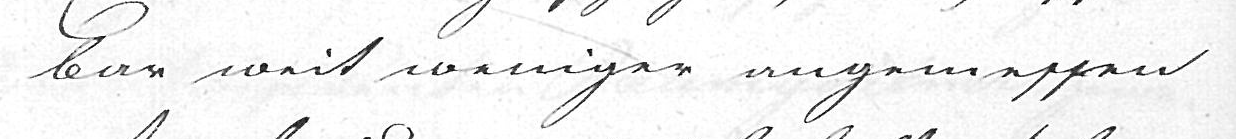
bar weit weniger angemessen
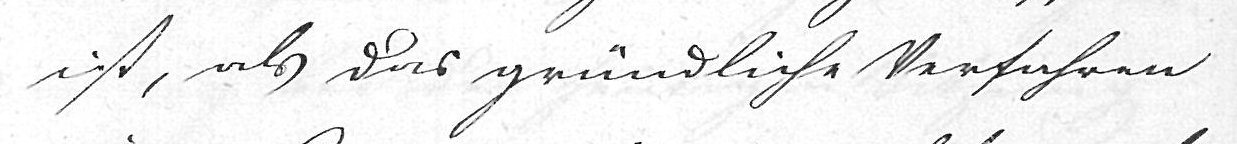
ist, als das gründliche Verfahren
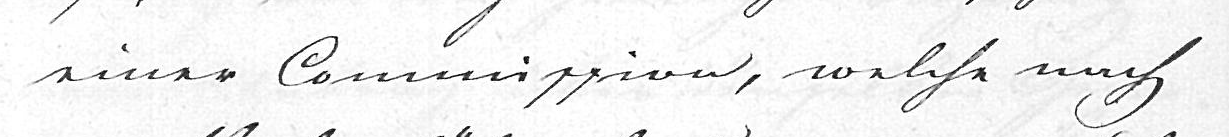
einer Commission, welche nach
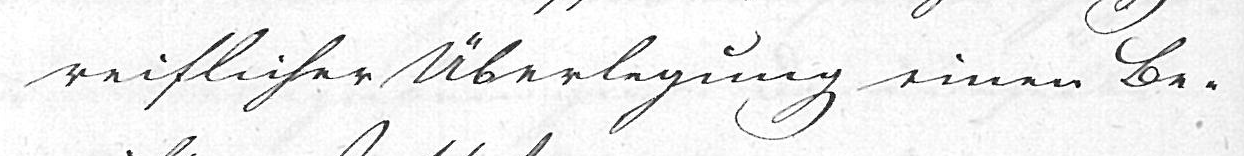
reiflicher Überlegung einen Be-
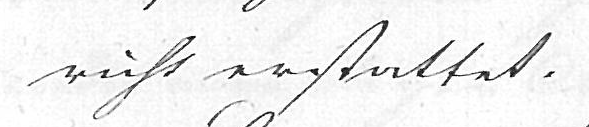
recht erstattet.
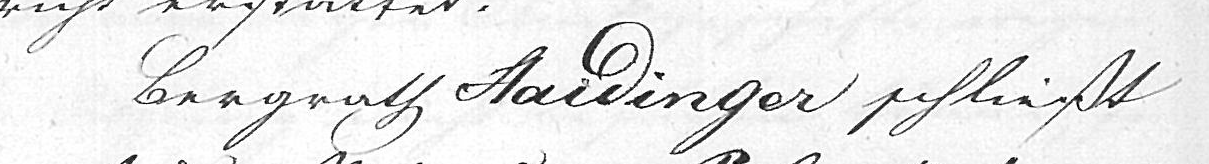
Bergrath Haidinger schließt
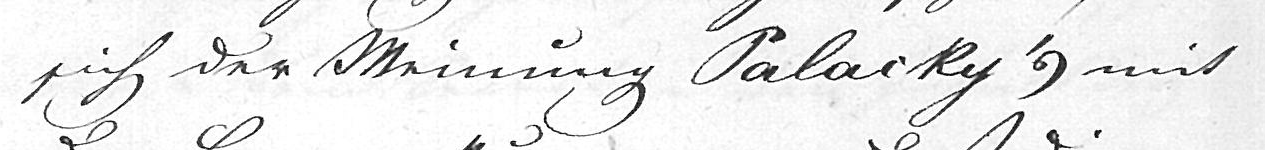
sich der Meinung Palacky's mit
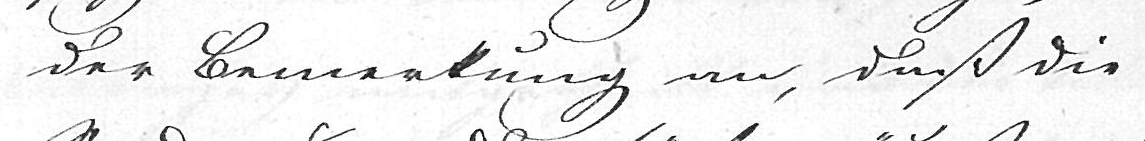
der Bemerkung an, daß die
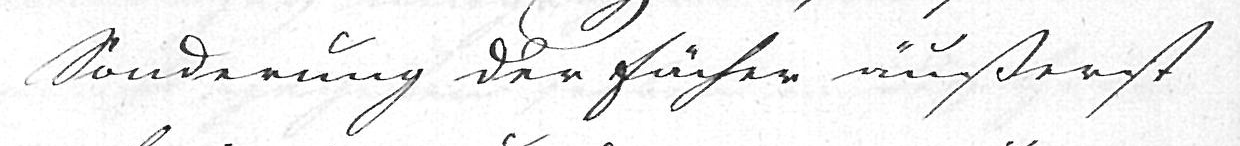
Sonderung der Fächer äußert
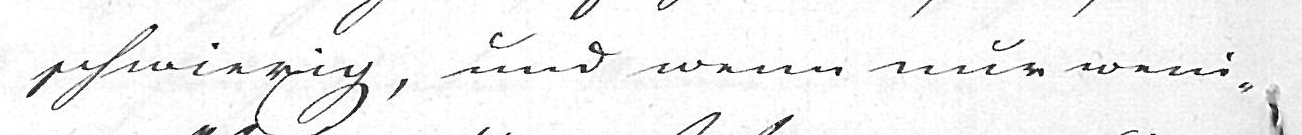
schwierig, und wenn nur weni-
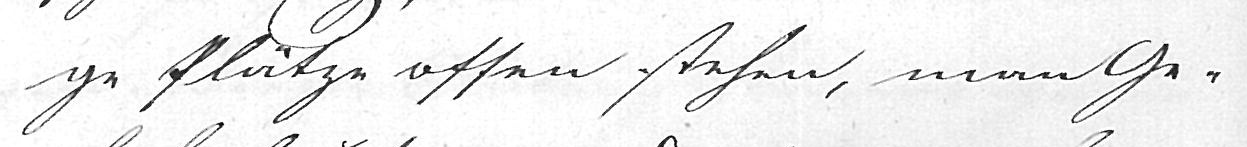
ge Plätze offen stehen, man Ge-
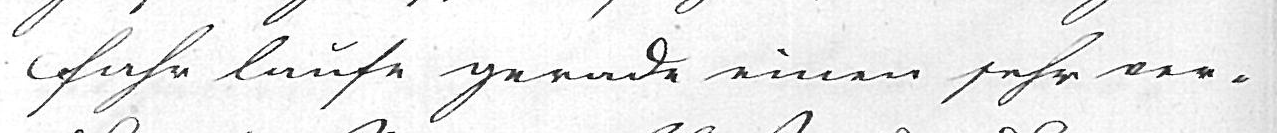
fahr laufe gerade einen sehr ver-
